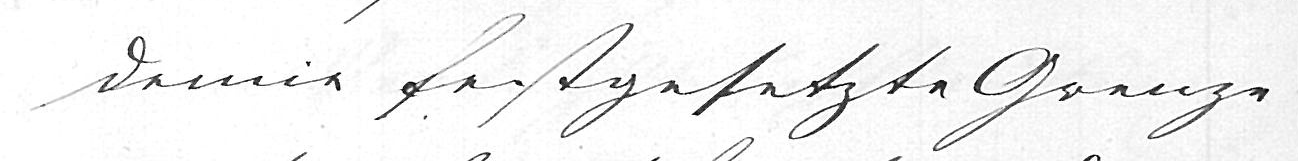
demie festgesetzte Grenze
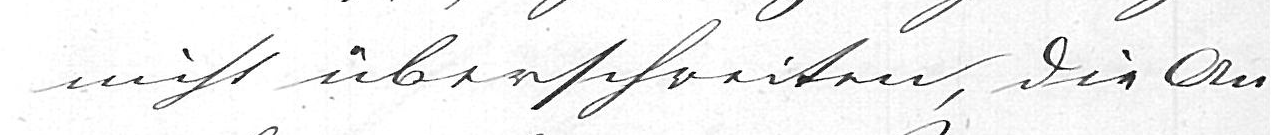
nicht überschreiten, die An-
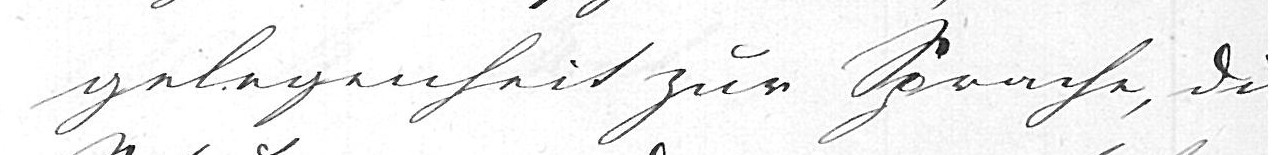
gelegenheit zur Sprache, die
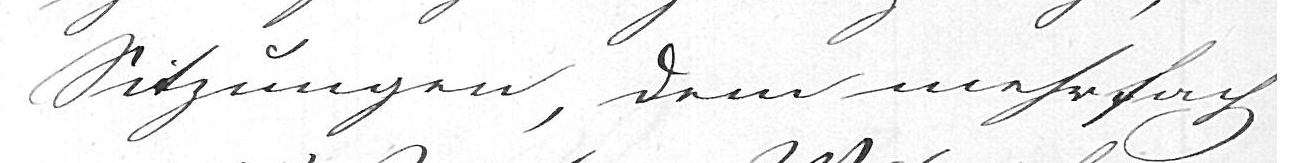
Sitzungen dem mehrfach
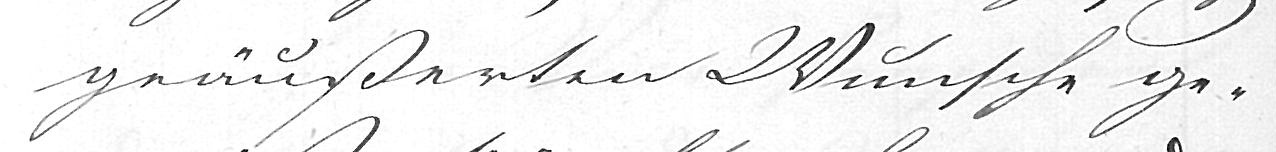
geäußerten Wunsche ge-
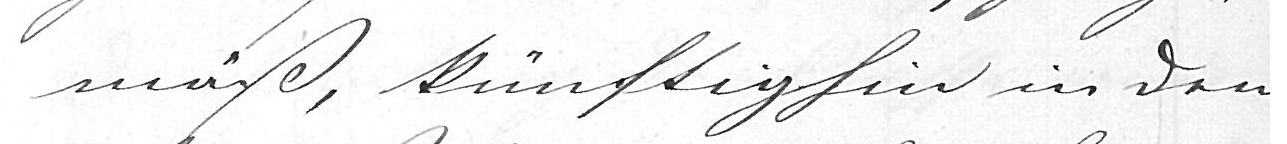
mäß, künftighin in den
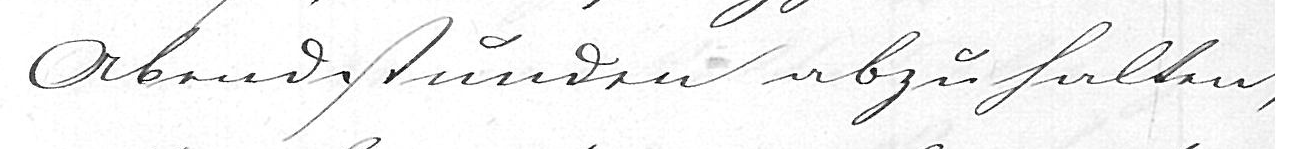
Abendstunden abzuhalten,
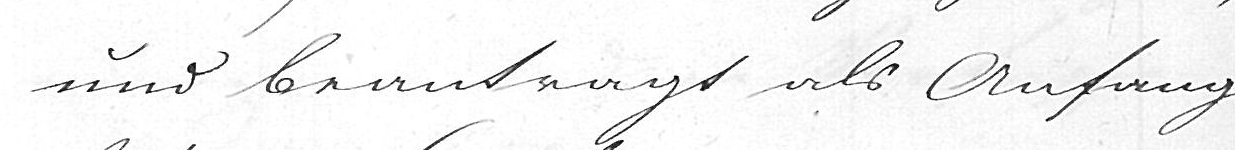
und beantragt als Anfangs
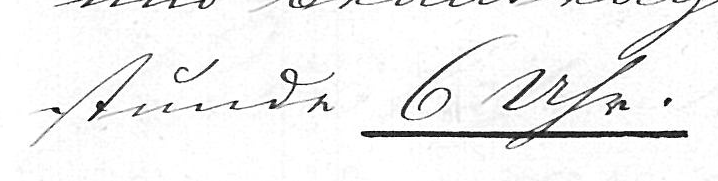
stunde 6 Uhr.
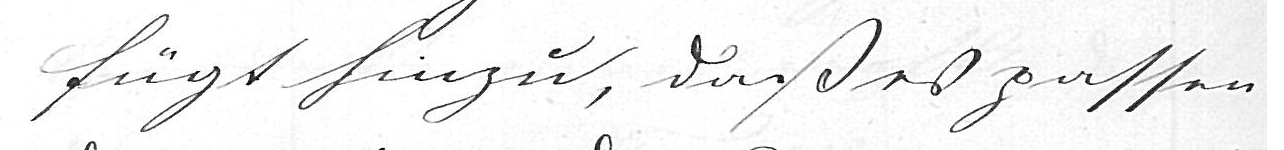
fügt hinzu, daß es passen-
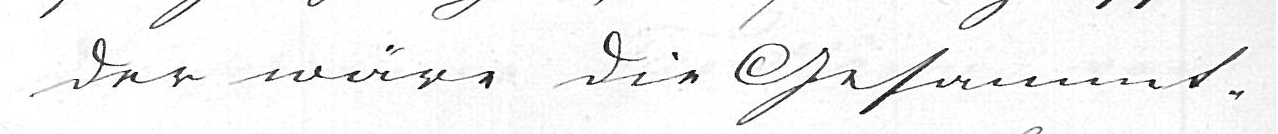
der wäre die Gesammt-
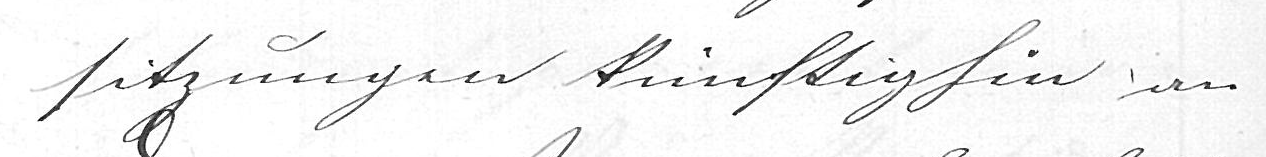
sitzungen künftighin an
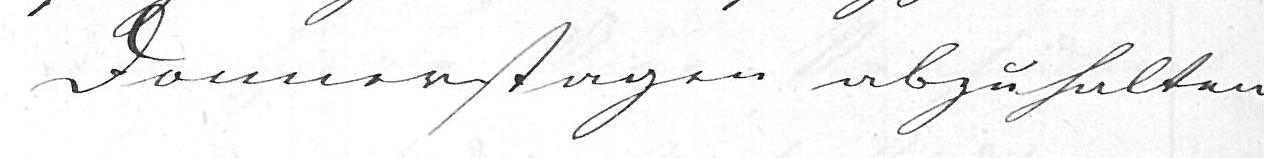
Donnerstagen abzuhalten.
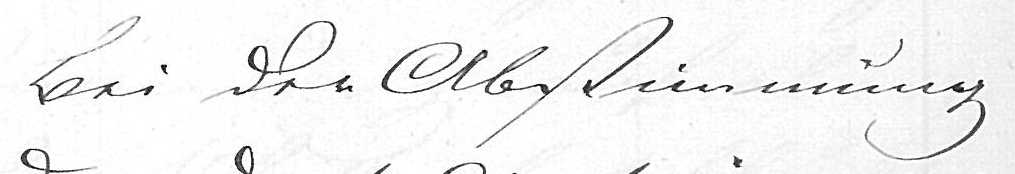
Bei der Abstimmung
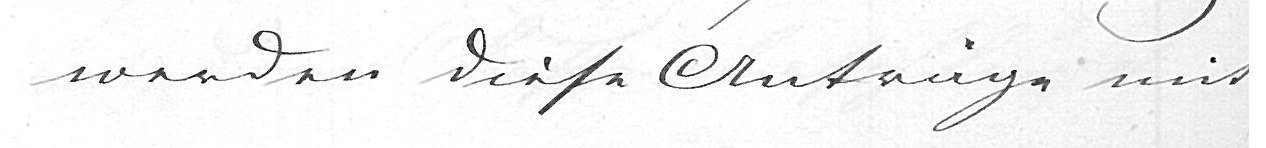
werden diese Anträge mit
